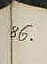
86.
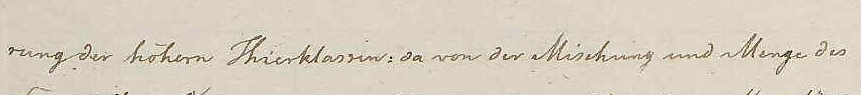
rung der höhern Thierklassen: da von der Mischung und Menge des
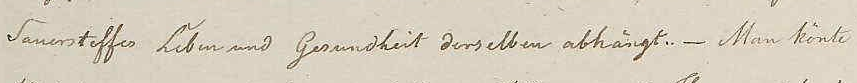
Sauerstoffs Leben und Gesundheit derselben abhängt. – Man könte
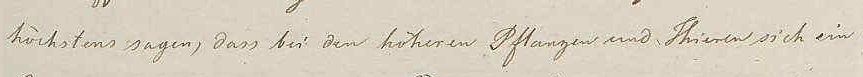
höchstens sagen, dass bei den höheren Pflanzen und Thieren sich ein
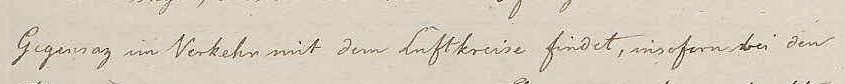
Gegensaz im Verkehr mit dem Luftkreise findet, insofern bei den
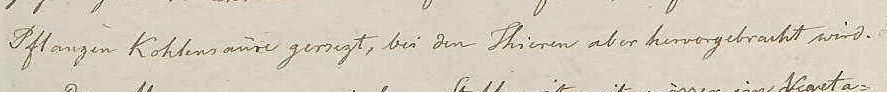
Pflanzen Kohlensäure zersezt, bei den Thieren aber hervorgebracht wird.
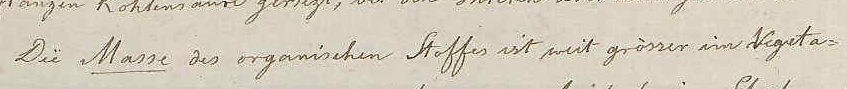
Die Masse des organischen Stoffes ist weit grösser im vVegeta-
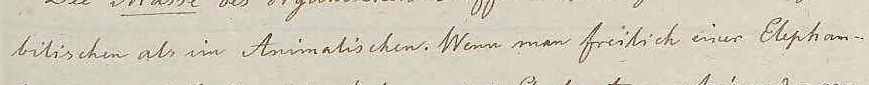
bilischen als im Animalischen. Wenn man freilich einer Elephan-
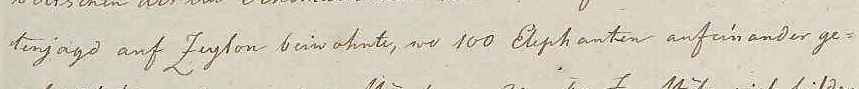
tenjagd auf Zeylon beiwohnte, wo 100 Elephanten aufeinander ge-
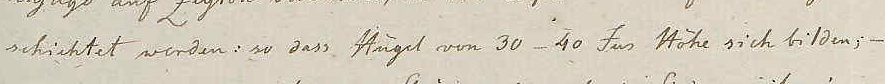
schichtet werden: so dass Hügel von 30–40 Fus Höhe sich bilden,; –
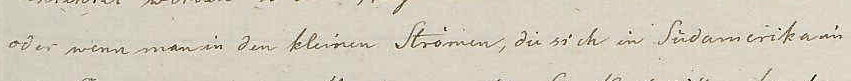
oder wenn man in den kleinen Strömen, die sich in Südamerika in
